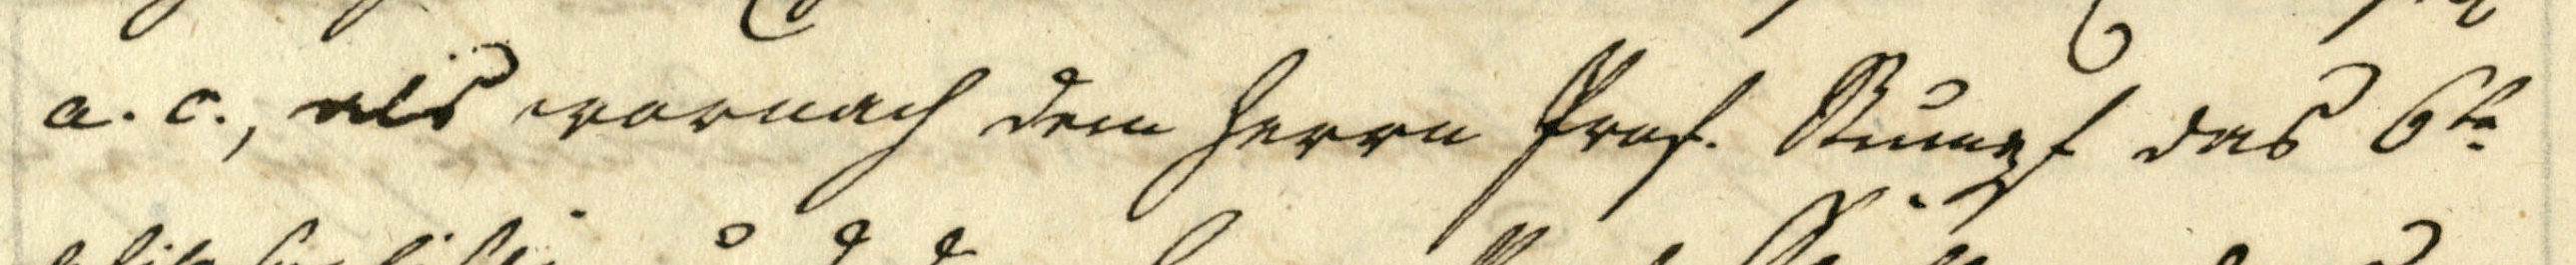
a. c, als wornach dem Herrn Prof. Stumpf das 6 te
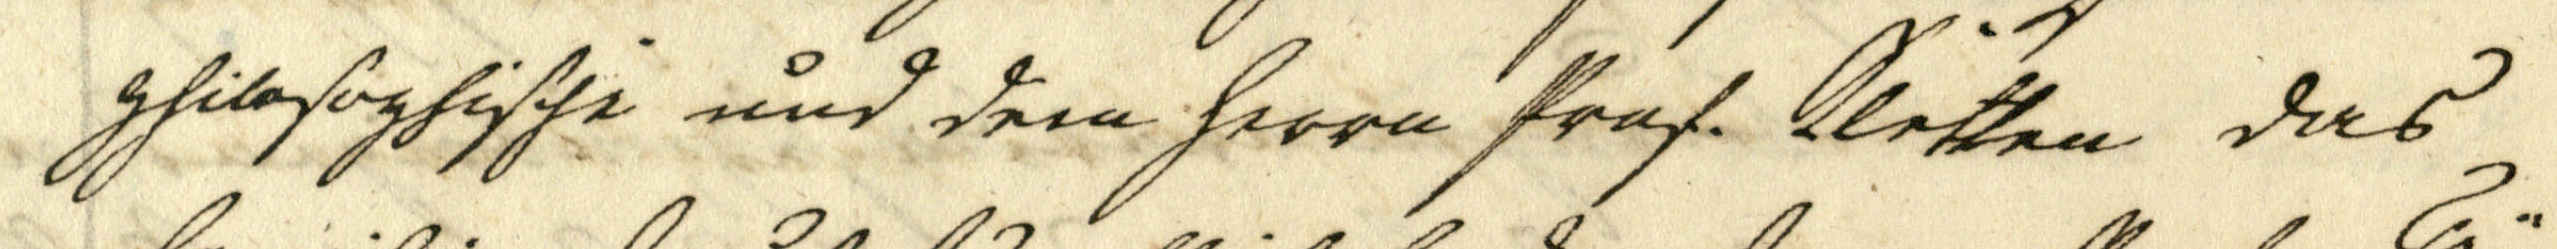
philosophische und dem Herrn Prof. Kletten das
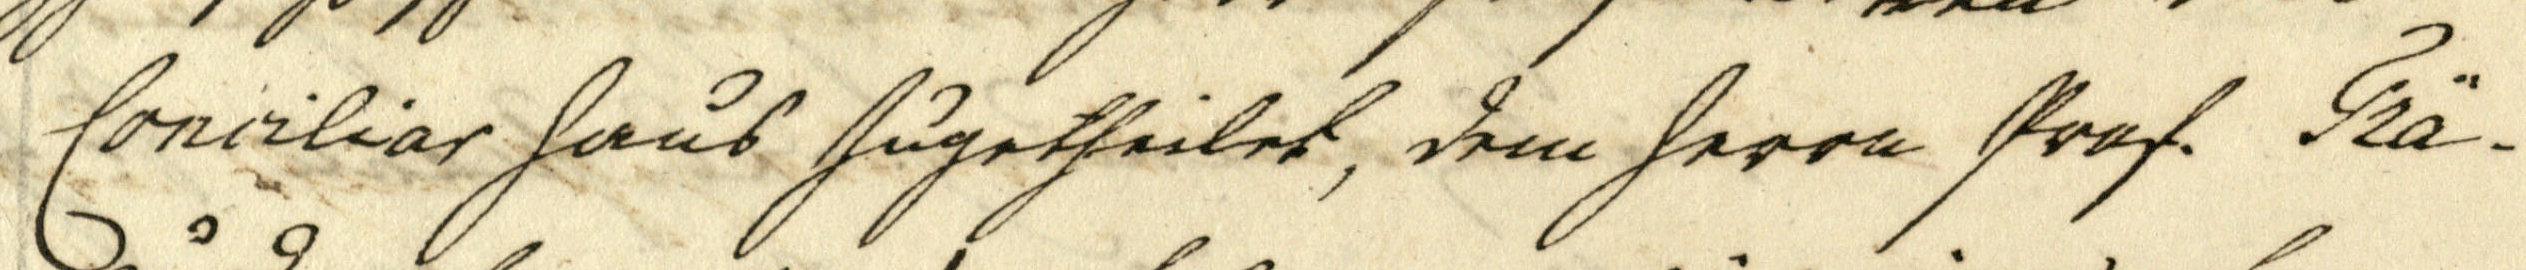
Conciliar Haus zugetheilet, dem Herrn Prof. Trä¬
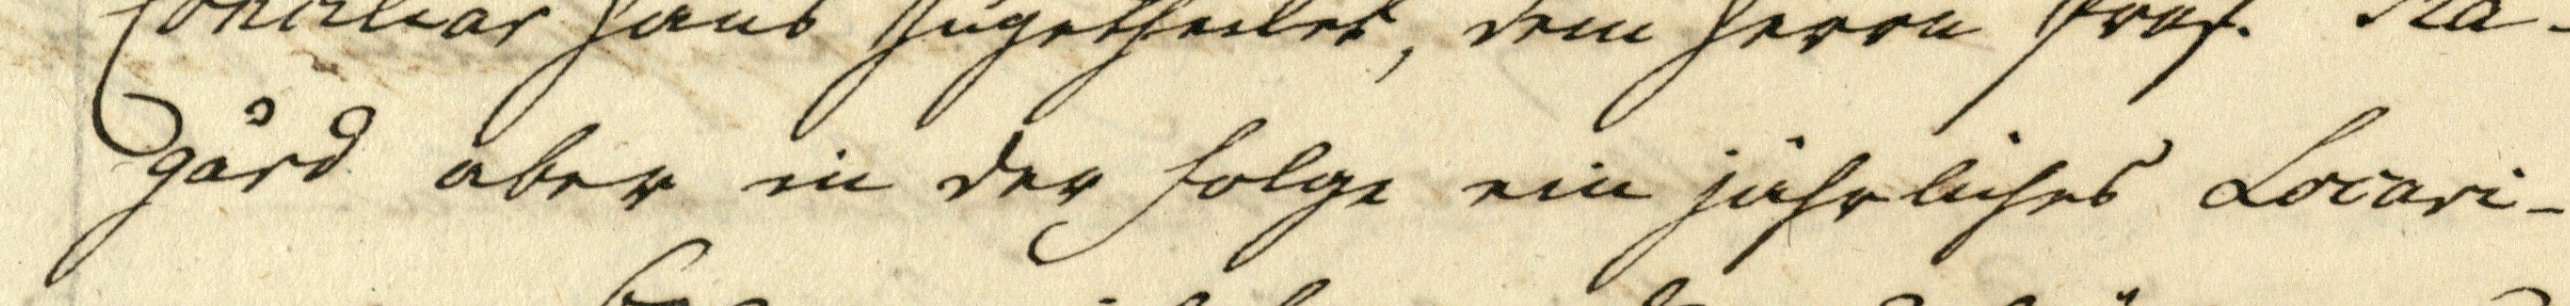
gård aber in der Folge ein jährliches Locari¬
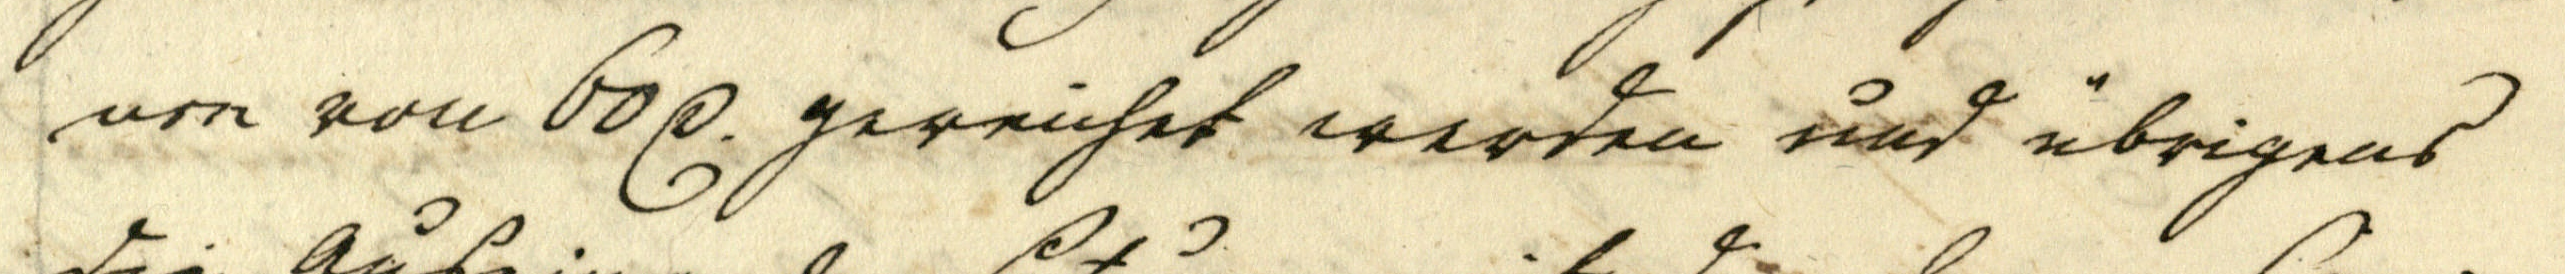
um von 60 l. gereichet werden und übrigens
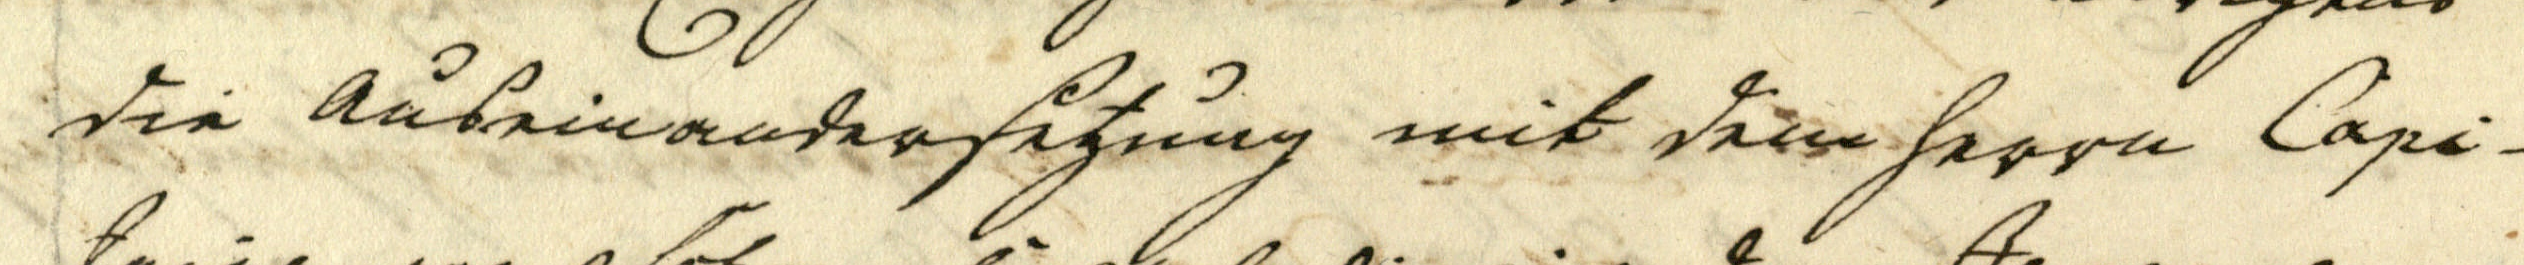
die Auseinandersetzung mit dem Herrn Capi¬
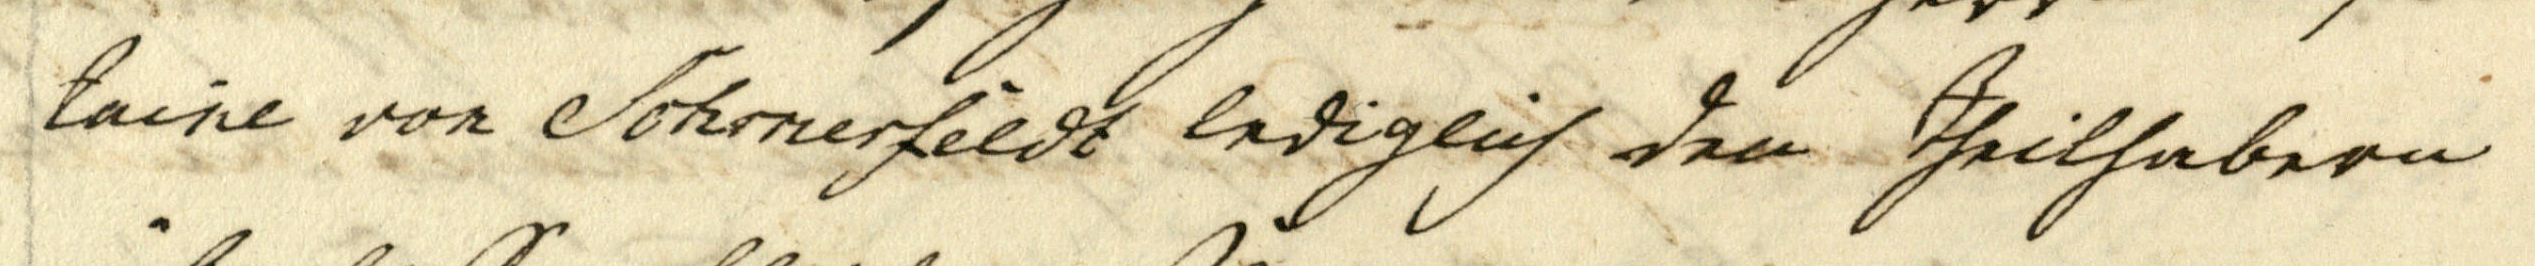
taine von Schmerfeldt lediglich den Theilhabern
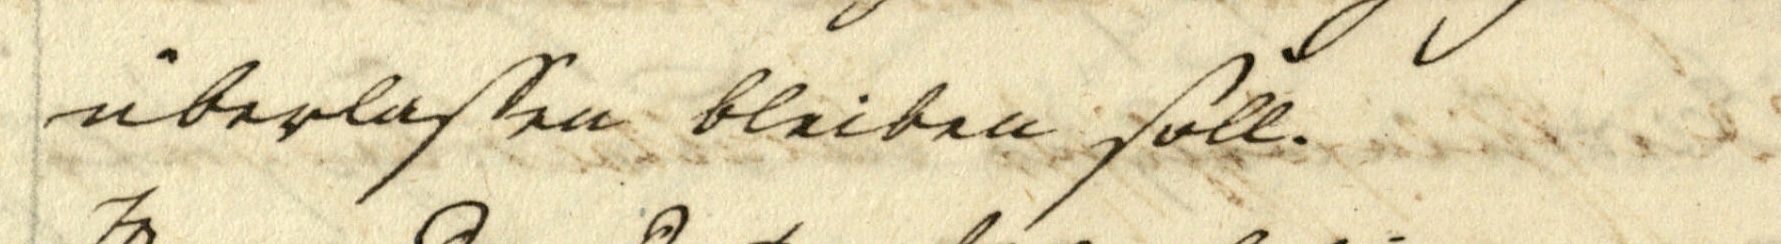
überlassen bleiben soll.
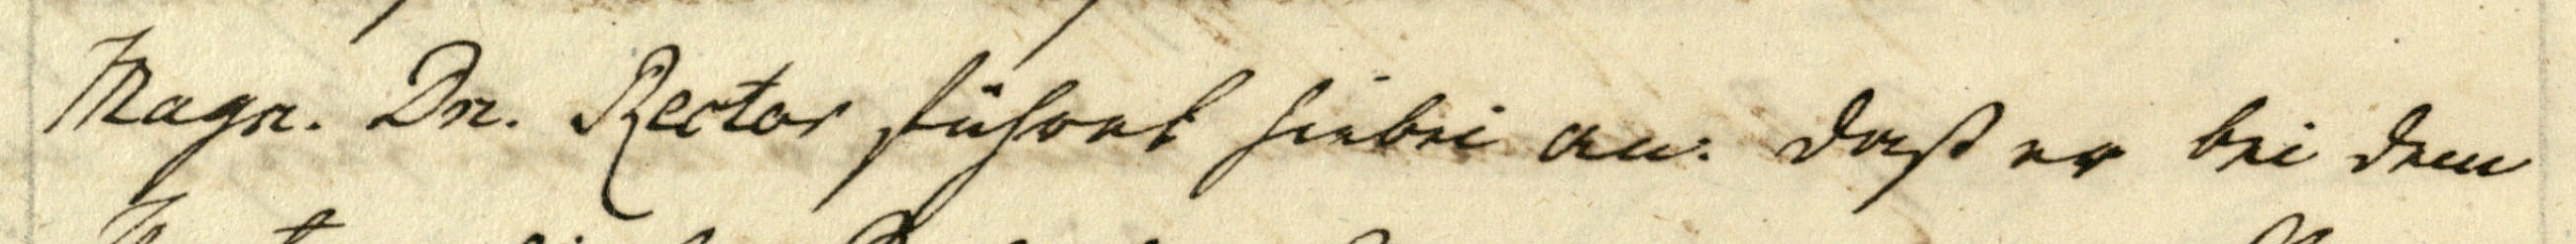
Magn. Dn. Rector führet hiebei an: daß er bei dem
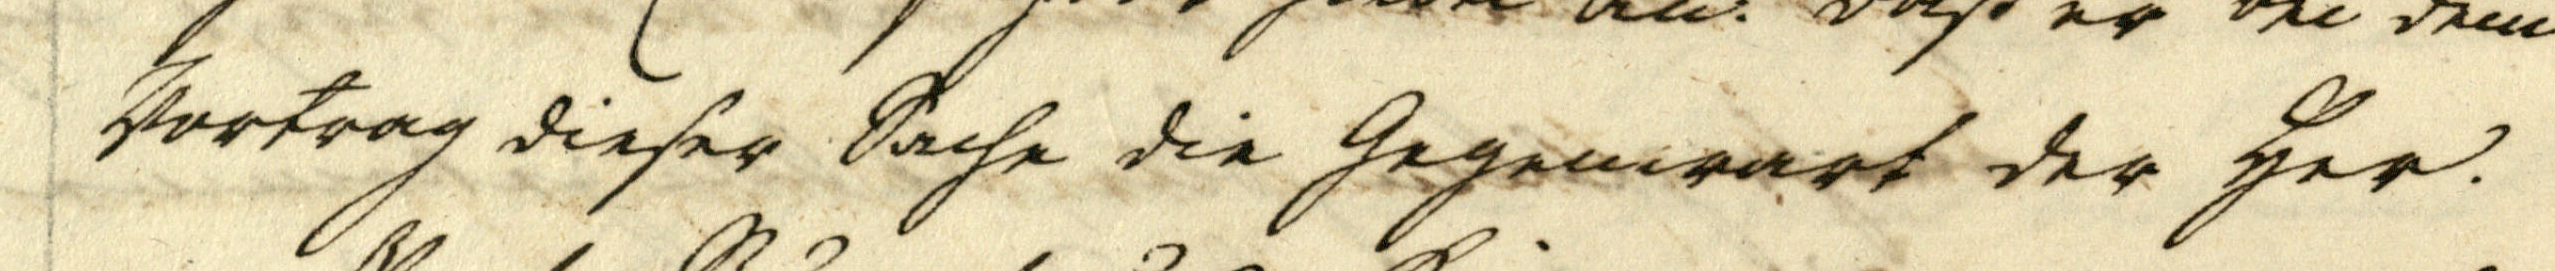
Vortrag dieser Sache die Gegenwart der Her¬
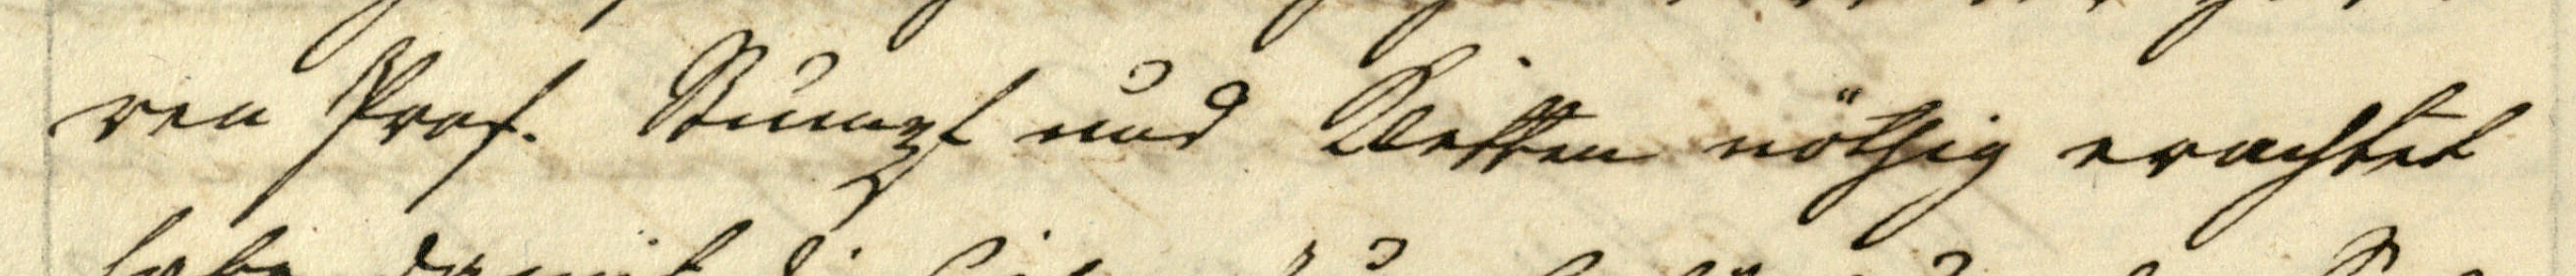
ren Prof. Stumpf und Kletten nöthig erachtet
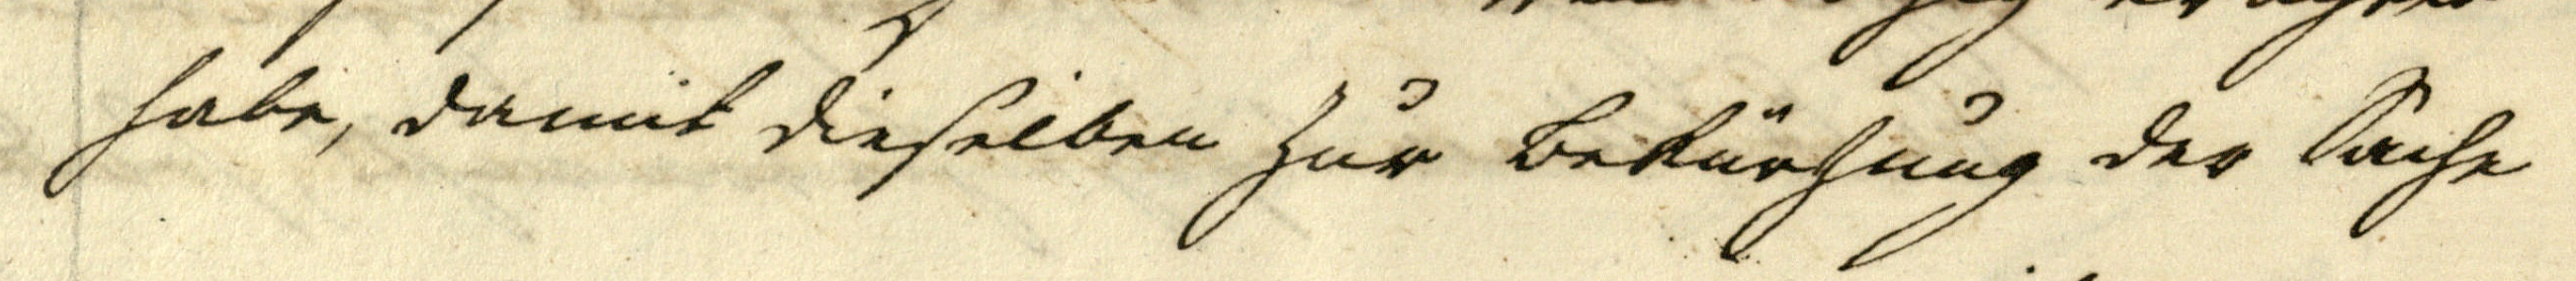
habe, damit dieselben zur Bekürzung der Sache
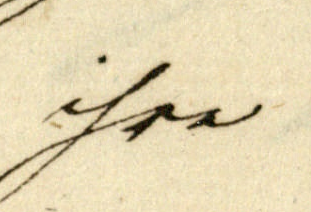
ihre
